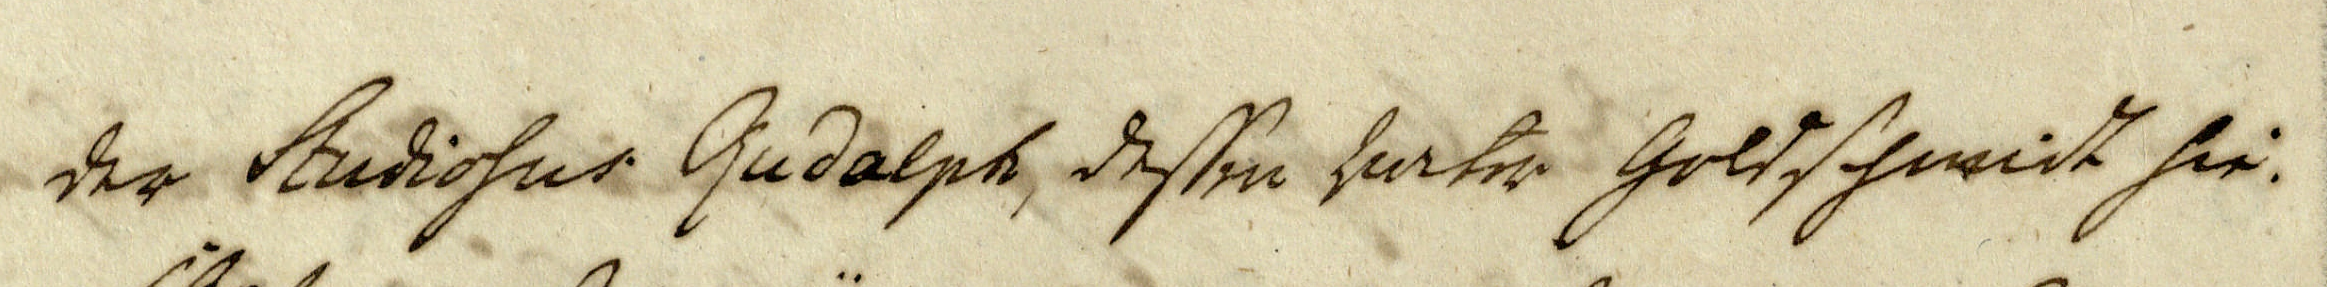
der Studiosus Rudolph, dessen Vater Goldschmidt hie¬
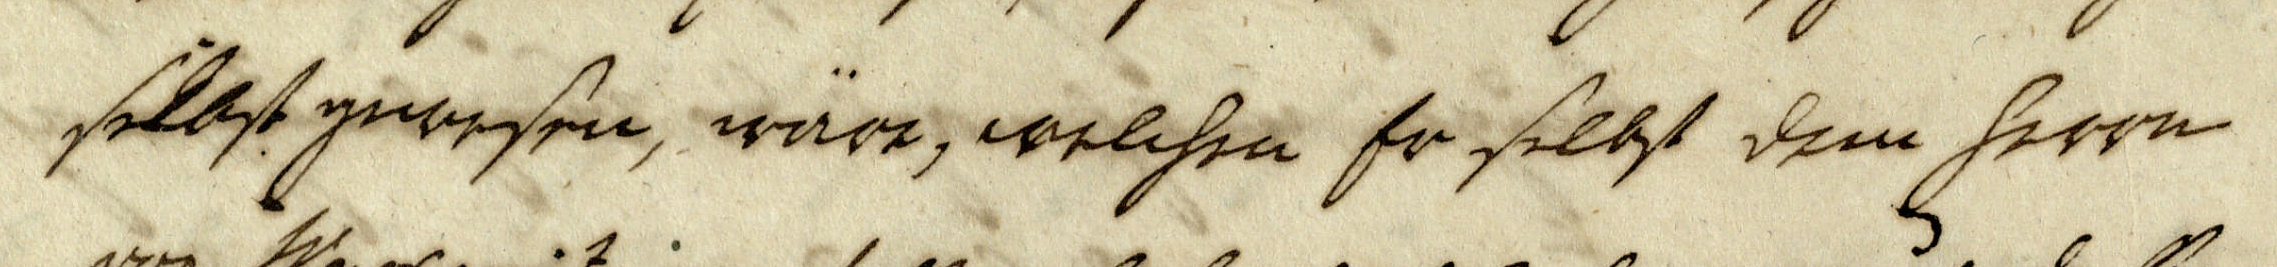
selbst gewesen, wäre, welchen Er selbst dem Herrn
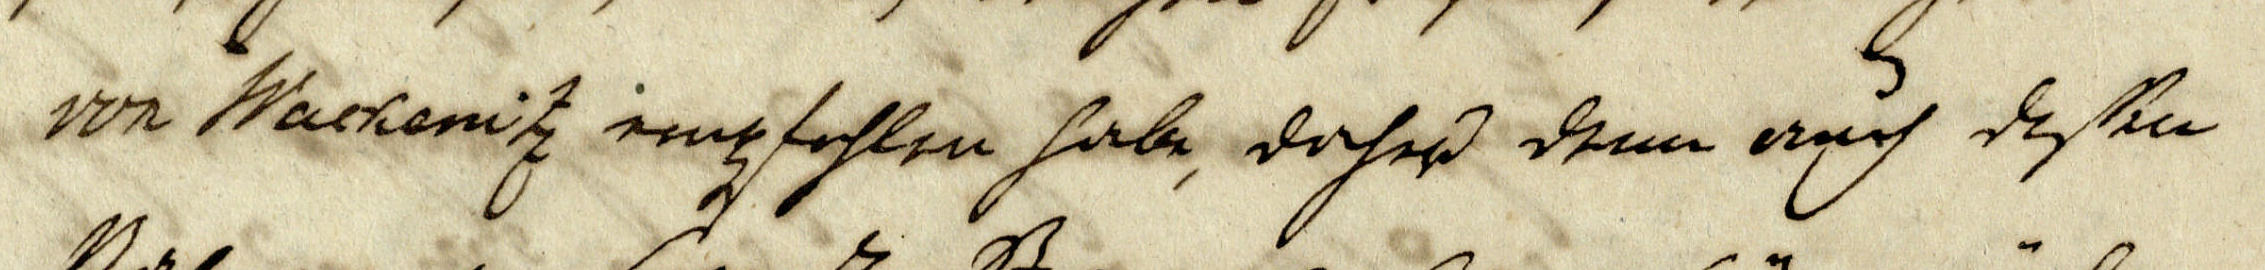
von Wackenitz empfohlen habe, daher denn auch dessen
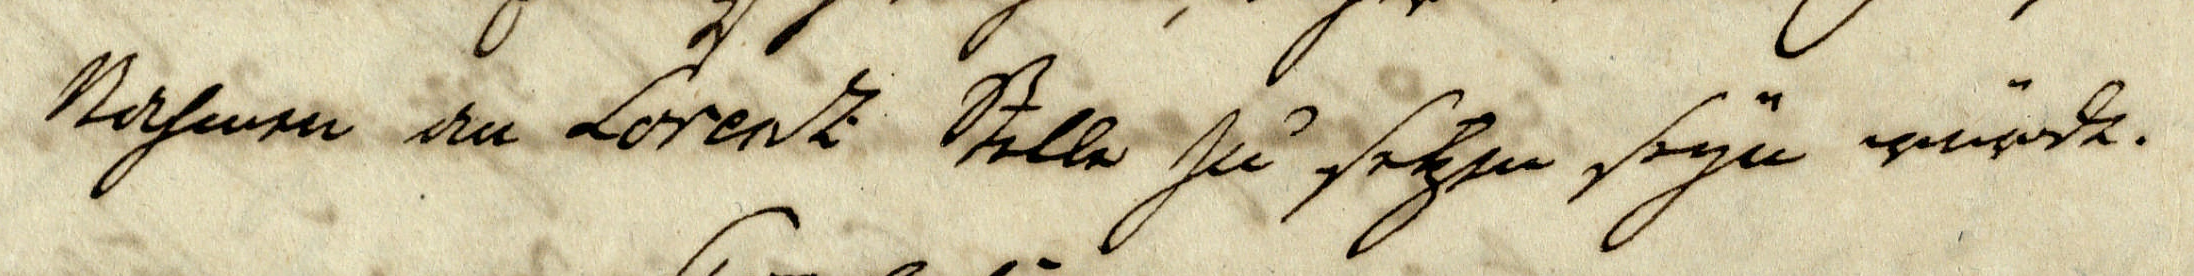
Nahmen an Lorenz Stelle zu setzen seÿn würde.
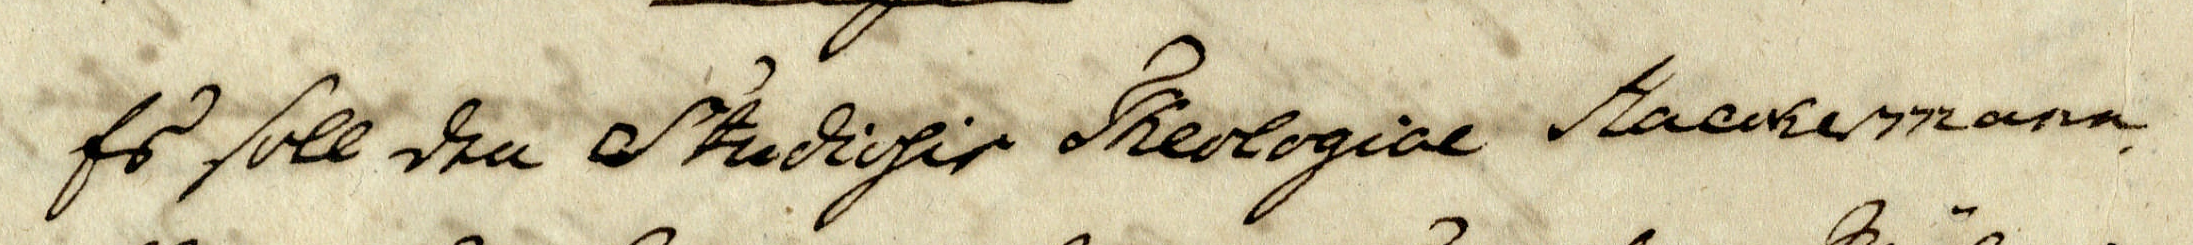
Es soll den Studiosis Theologiae Haeckermann,
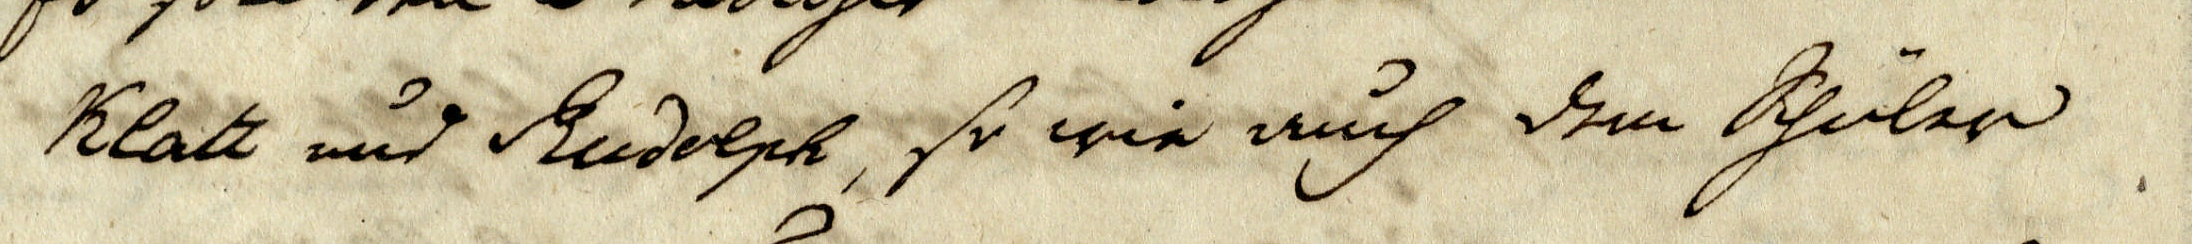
Klatt und Rudolph, so wie auch dem Schüler
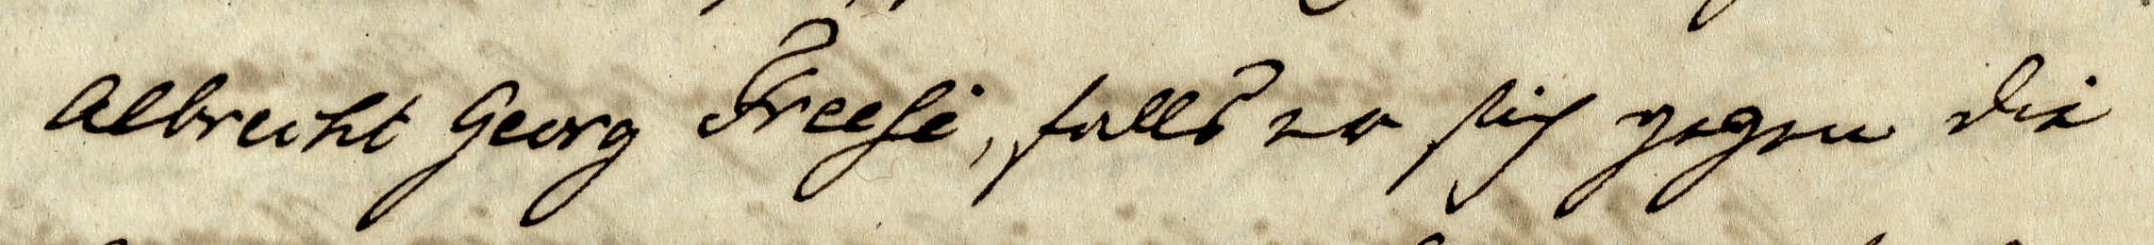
Albrecht Georg Freese, falls er sich gegen die
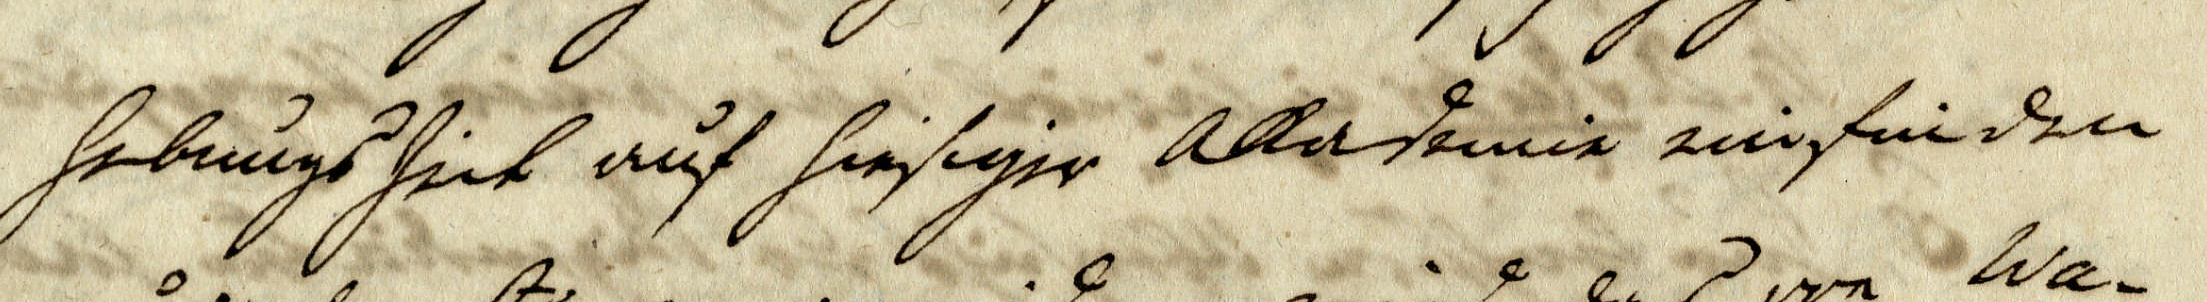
Hebungs Zeit auf hiesiger Akademie einfinden
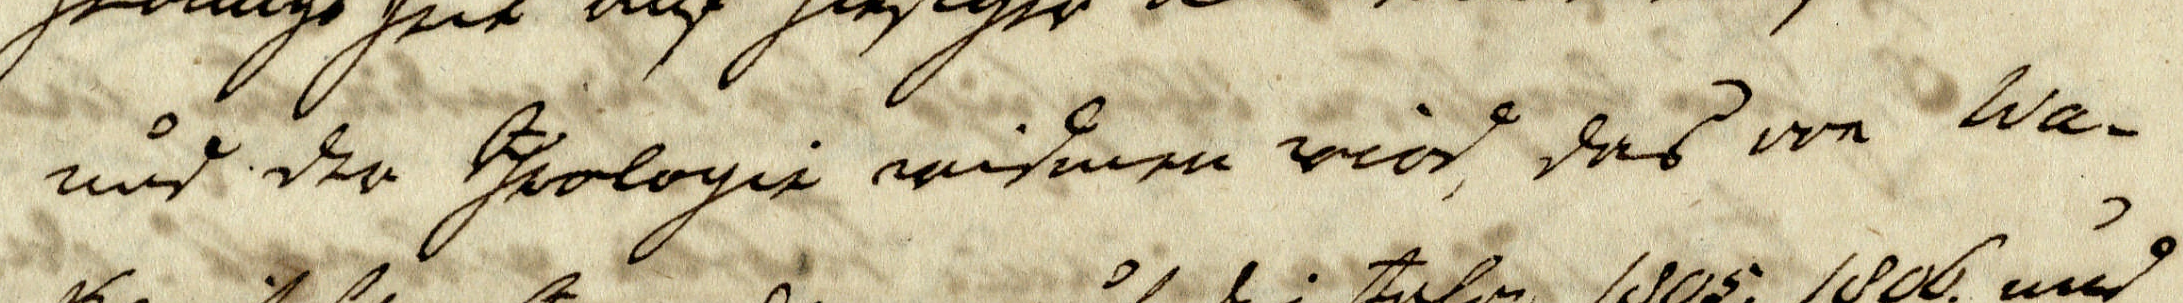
und der Theologie widmen wird, das von Wa¬
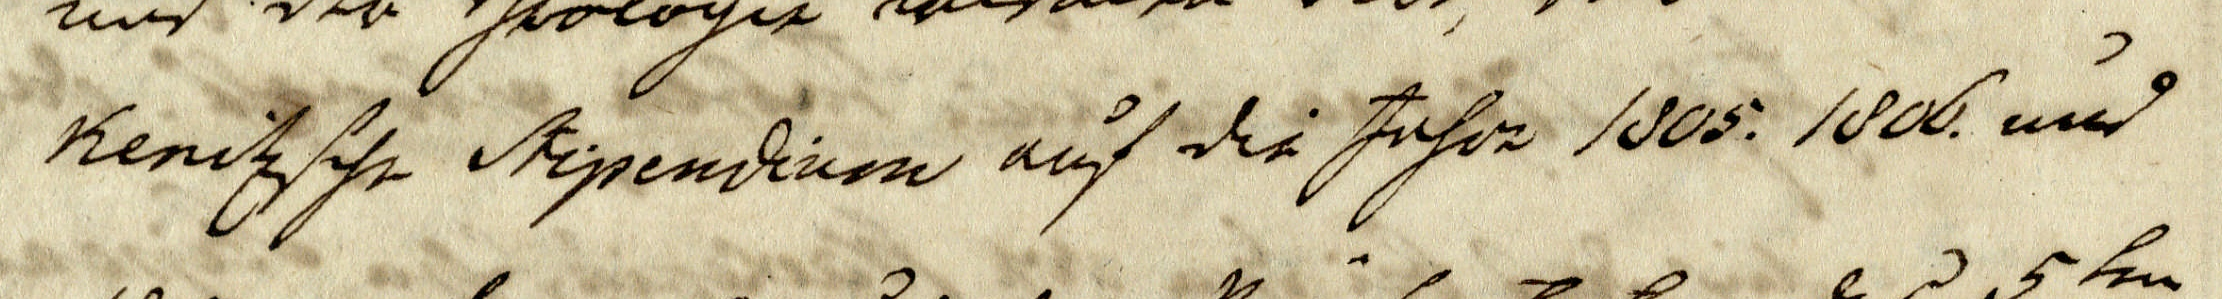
kenitzsche Stipendium auf die Jahre 1805. 1806. und
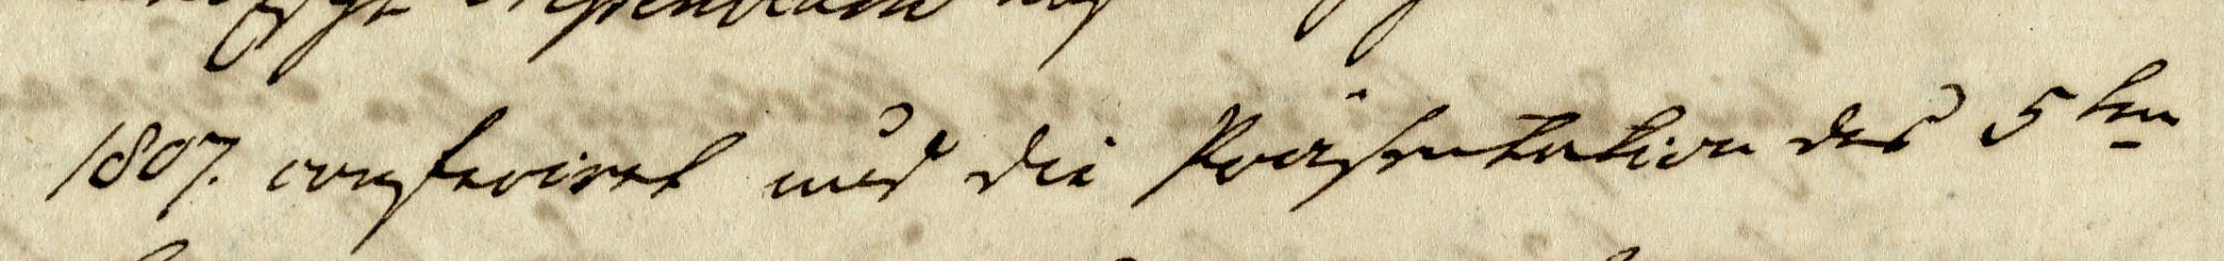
1807. conferiret und die Präsentation des 5 ten
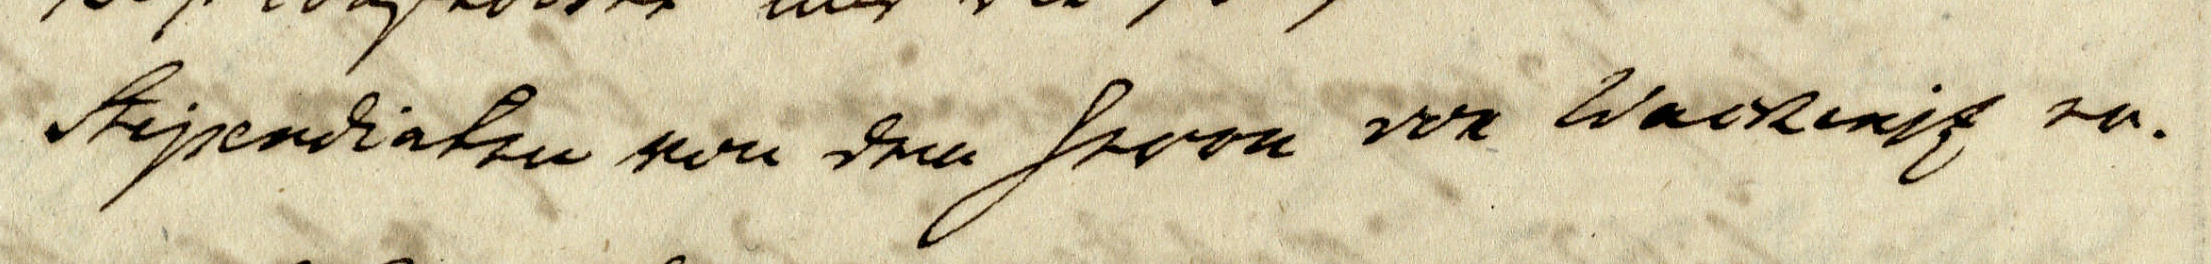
Stipendiaten von dem Herrn von Wackenitz er¬
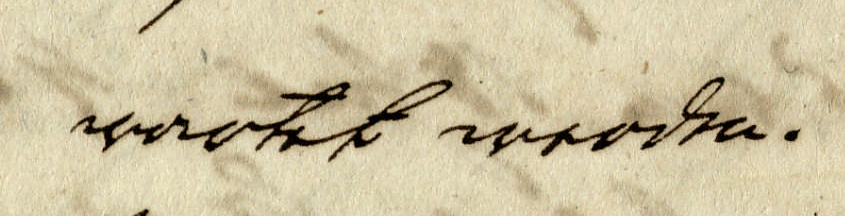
wartet werden.
